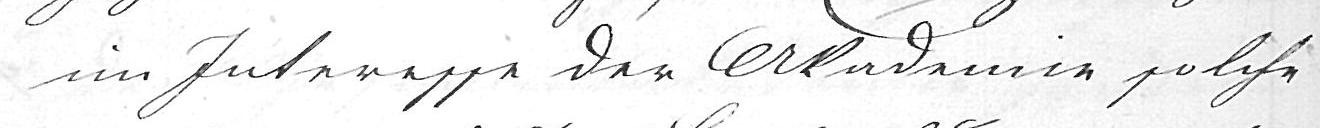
im Interesse der Akademie solche
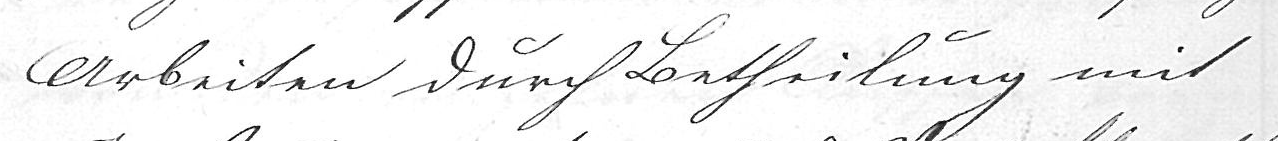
Arbeiten durch Betheilung mit
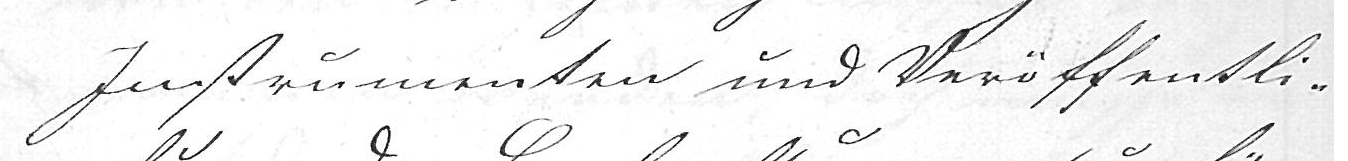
Instrumenten und Veröffentli-
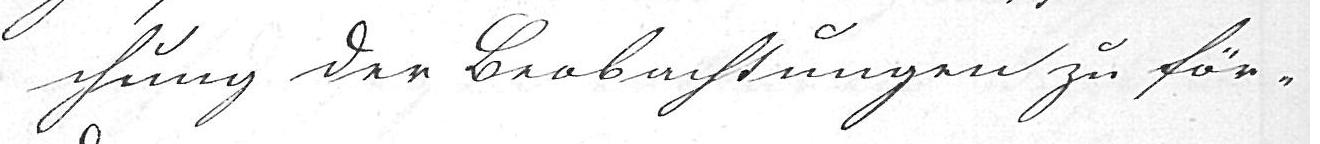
lung der Beobachtungen zu för-
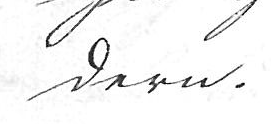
dern.
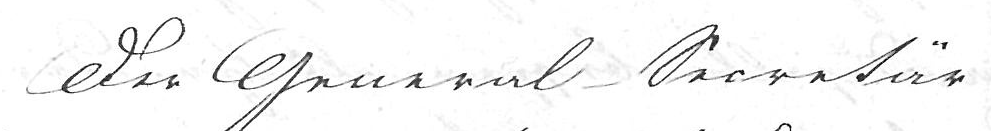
Die General-Secretär
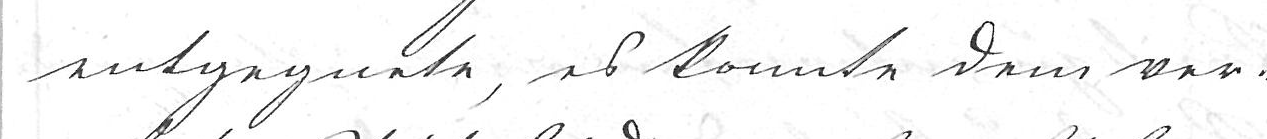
entgegnete, es konnte dem ver-
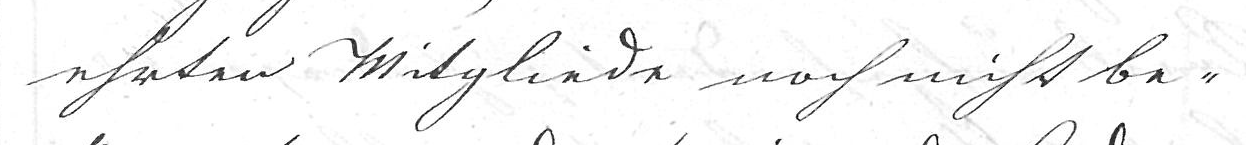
ehrten Mitgliede noch nicht be-
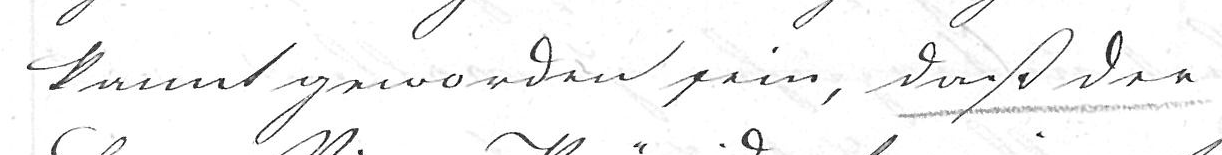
kannt geworden ein, daß der
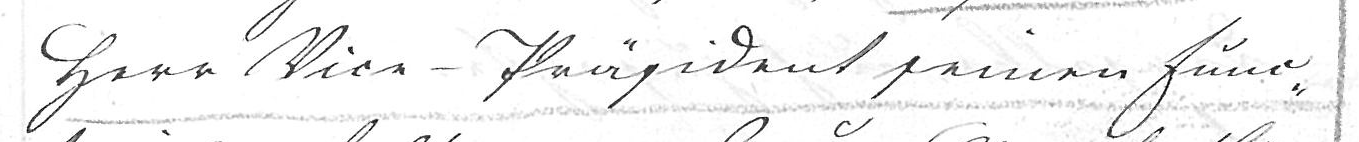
Herr Vice-Präsident seinen Func-
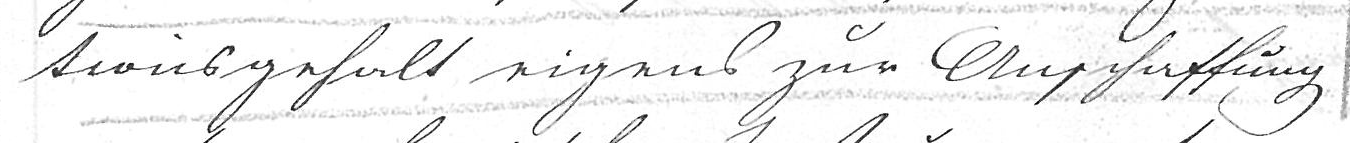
tionsgehalt eigens zur Anschaffung
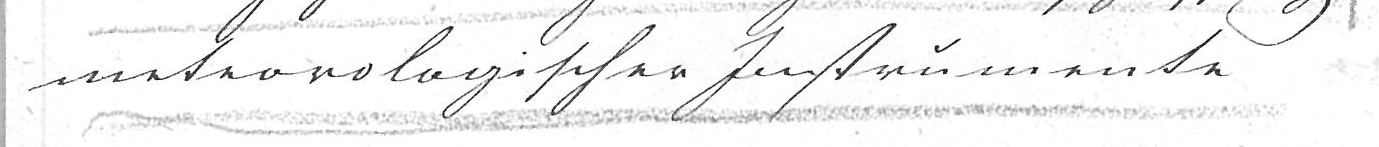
meteorologischer Instrumente
